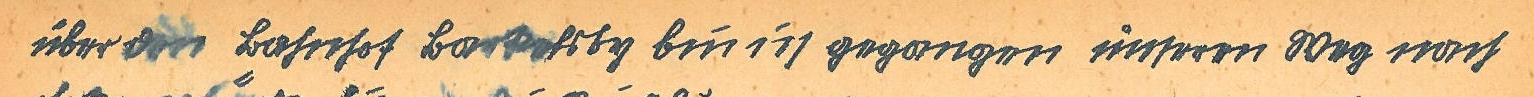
Über den Bahnhof B. bin ich gegangen unseren Weg nach
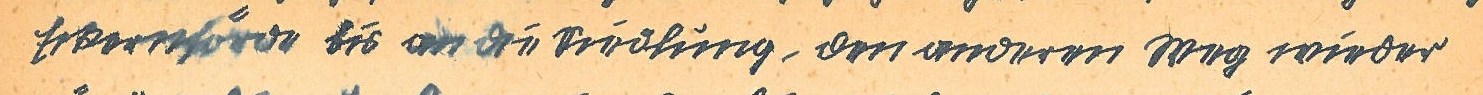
E. bis in die Siedlung, den anderen Weg wieder
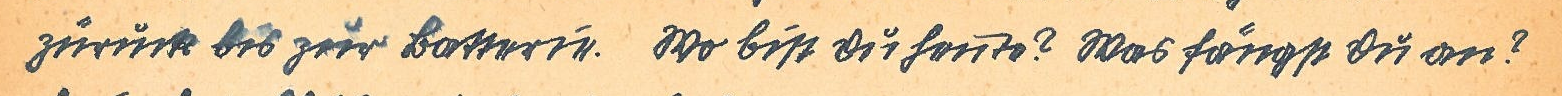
zurück zur Batterie. Wo bist Du heute? Was fängst Du an?
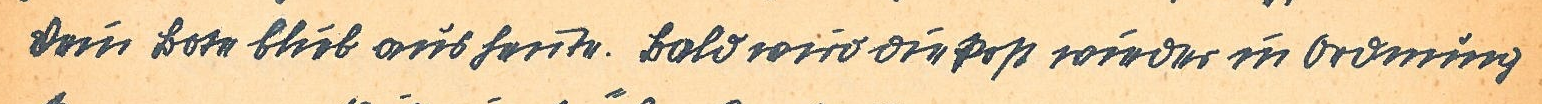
Dein Bote blieb aus heute. Bald wird die Post wieder in Ordnung
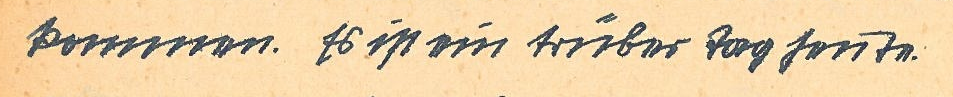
kommen. Es ist ein trüber Tag heute.
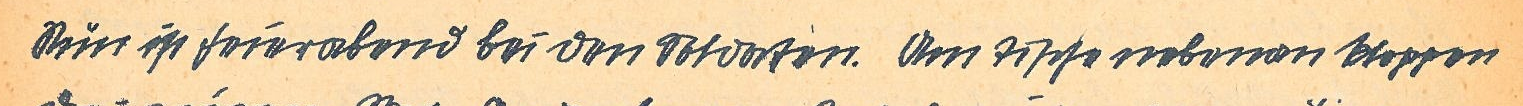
Nun ist Feierabend bei den Soldaten. Am Tische nebenan kloppen
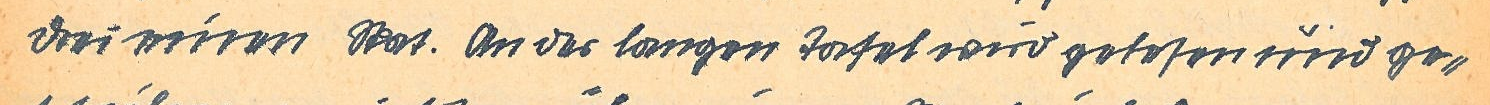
Drei einen Skat. An der langen Tafel wird gelesen und ge¬
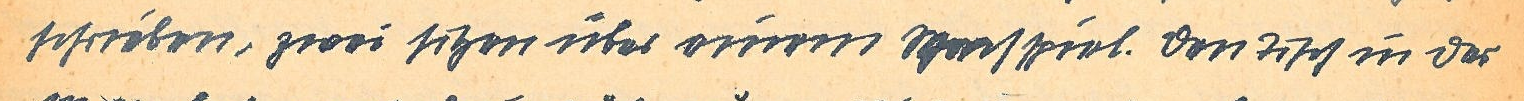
schrieben, zwei sitzen über einem Sch[ach]spiel. Den Tisch in der
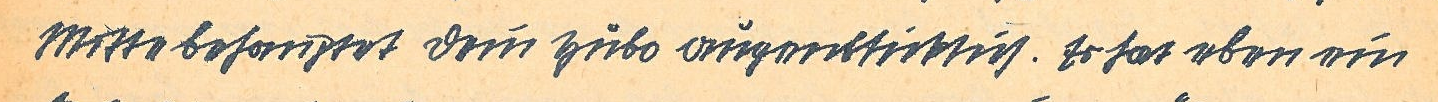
Mitte behauptet Dein Hubo augenblicklich. Er hat eben ein
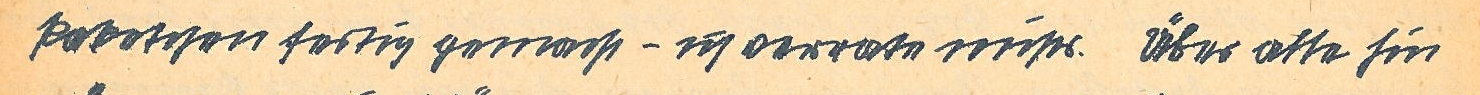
Paketchen fertig gemacht – ich verrate nichts. Über alle hin
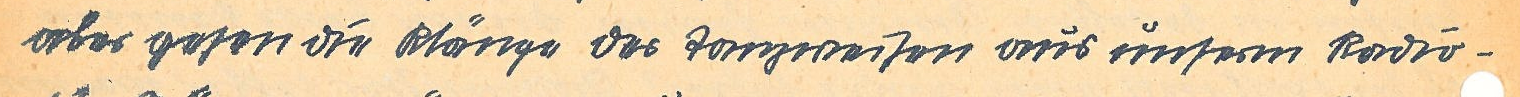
aber gehen die Klänge der Tanzweisen aus unserem Radio –
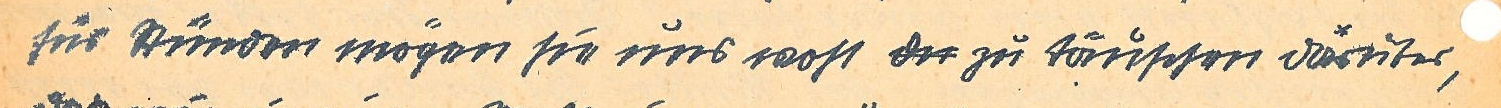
für Stunden mögen sie uns wohl der zu täuschen darüber,
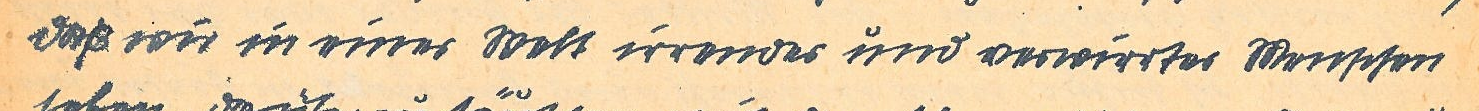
daß wir in einer Welt irrender und verwirrter Menschen
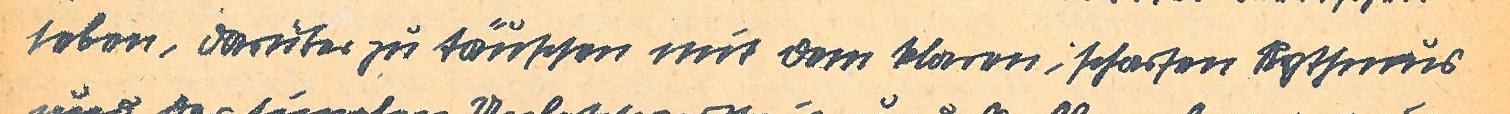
leben, darüber zu täuschen mit dem klaren, scharfen Rhythmus
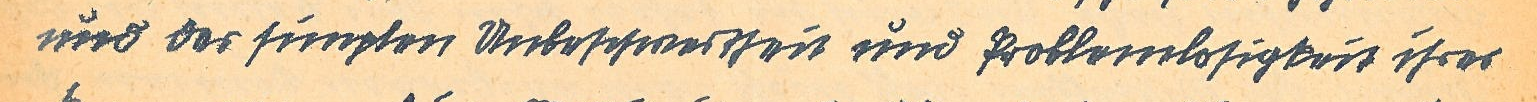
und der simplen Unbeschwertheit und Problemlosigkeit ihrer
